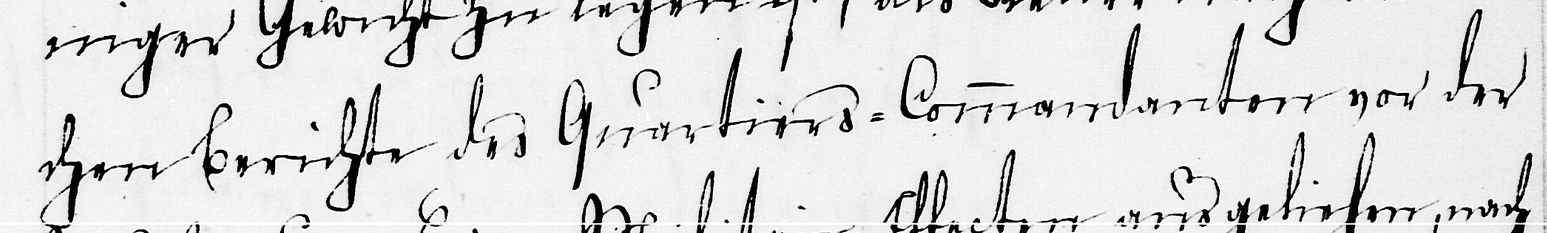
chen Berichte des Quartiers-Commandanten vor der
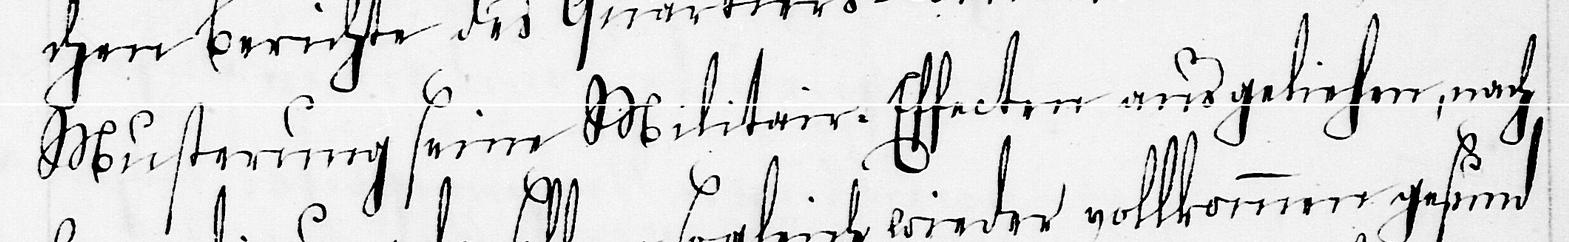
Musterung seine Militair-Effecten ausgeliehen, nach
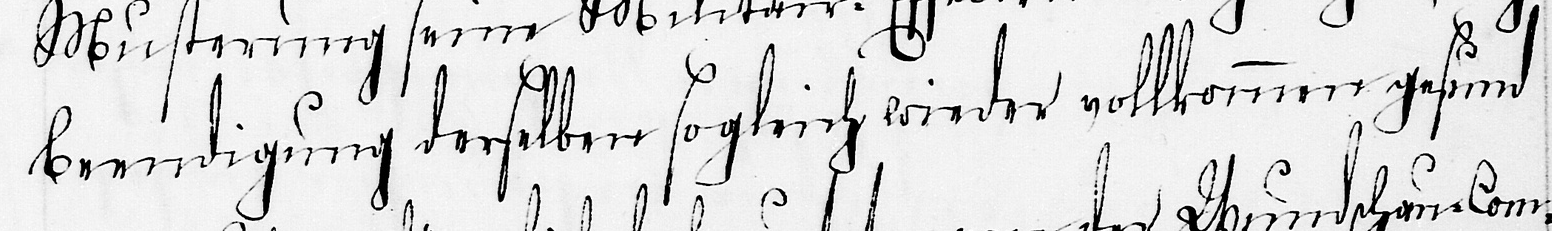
Beendigung derselben sogleich wieder vollkommen gesund
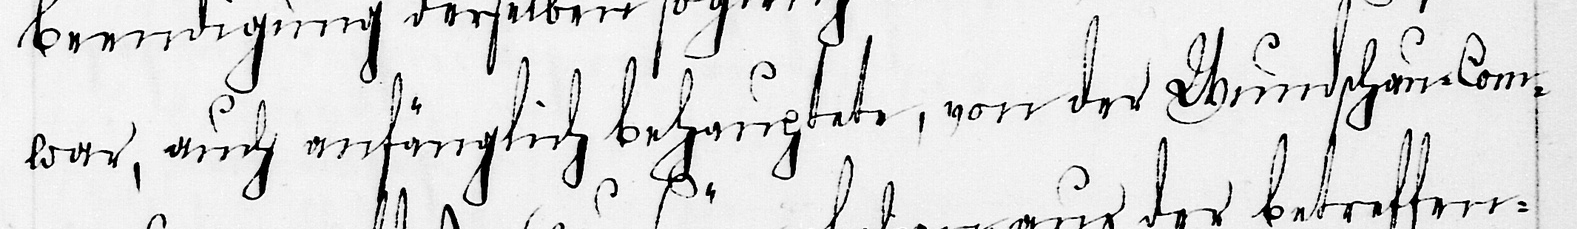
war, auch anfänglich behauptete, von der Wundschau-Com¬
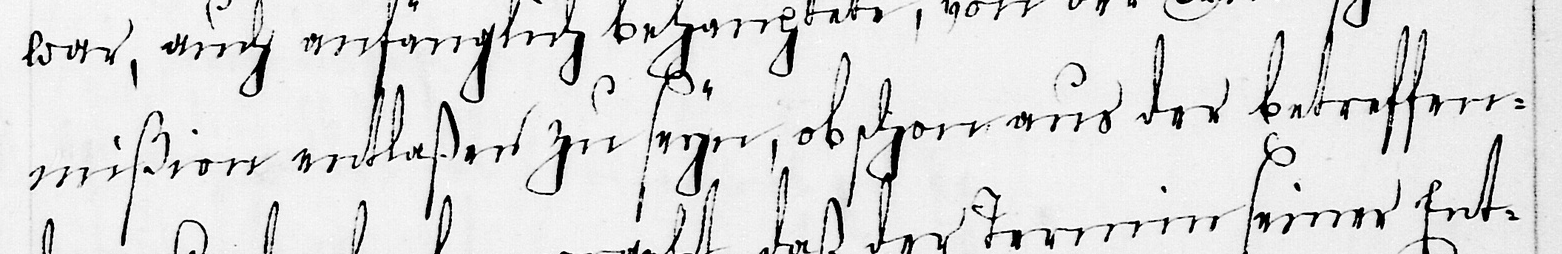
mißion entlaßen zu seyn, obschon aus der betreffen¬
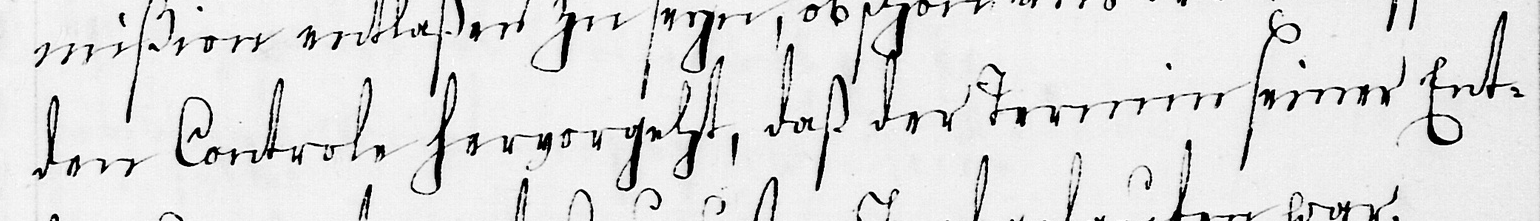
den Controle hervorgeht, daß der Termin seiner Ent¬
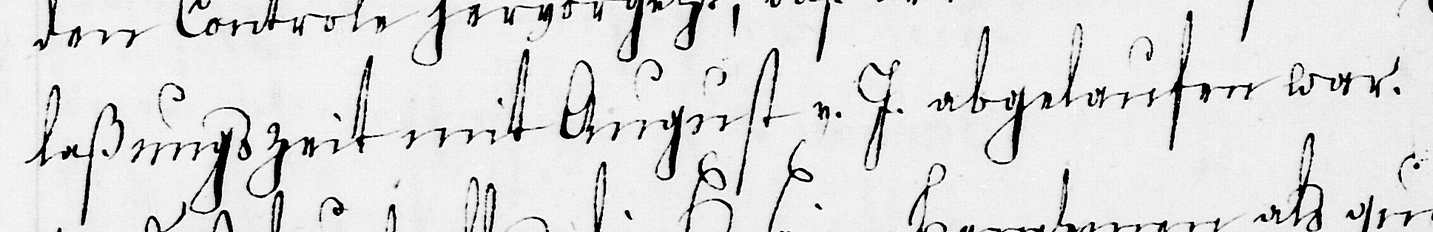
laßungszeit mit August v. J. abgelaufen war.
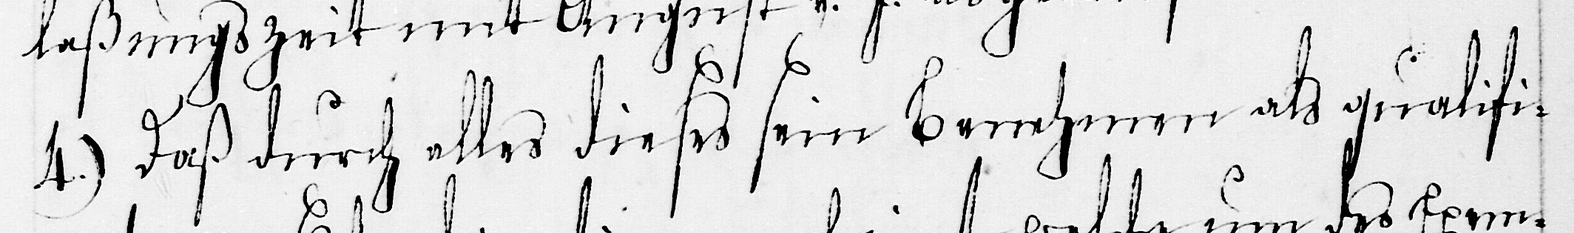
4.) Daß durch alles dieses sein Benehmen als qualifi¬
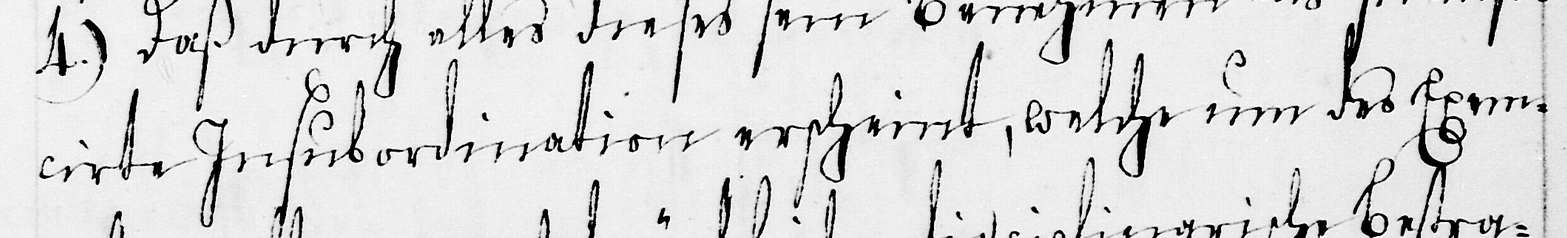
cirte Insubordination erscheint, welche um des Exem¬
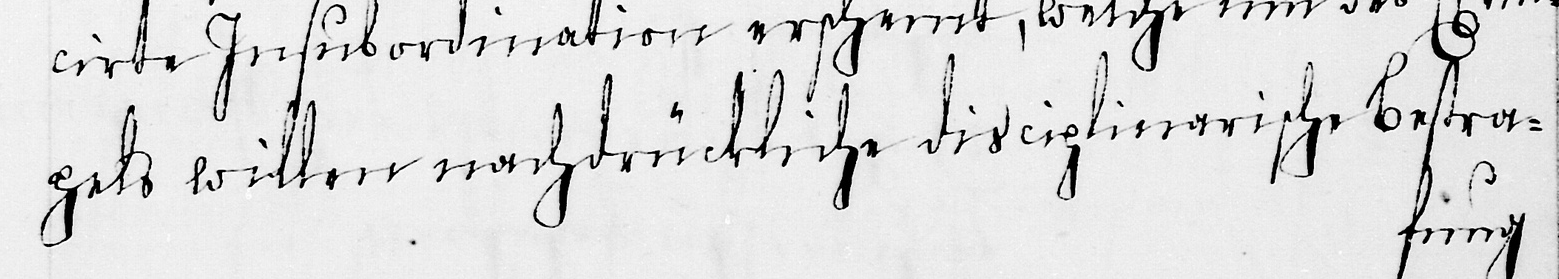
pels willen nachdrückliche disciplinarische Bestra-
